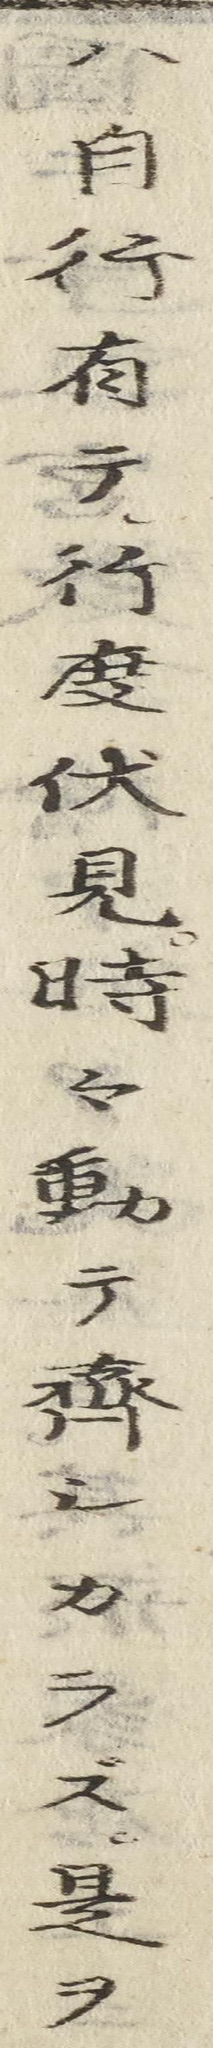ハ自行有テ。行度伏見。時々動テ斉シカラズ。是ヲ
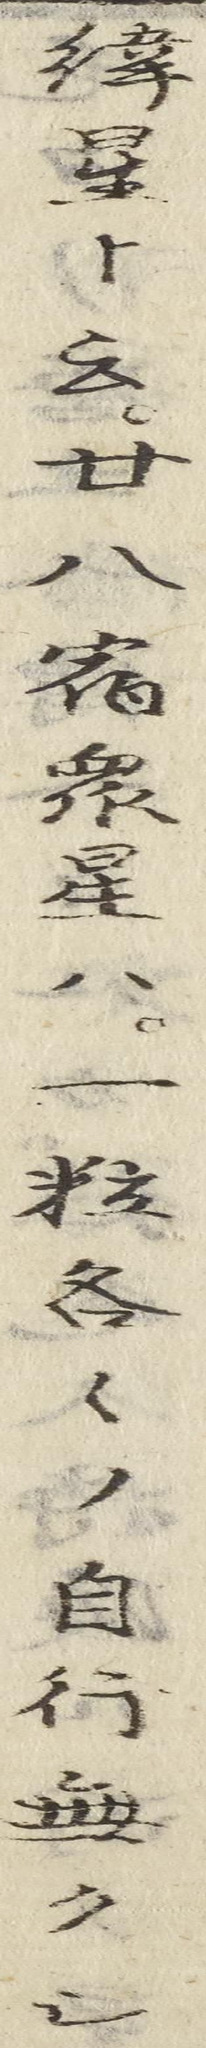緯星ト云。二十八宿衆星ハ。一粒各〳〵ノ自行無クシ
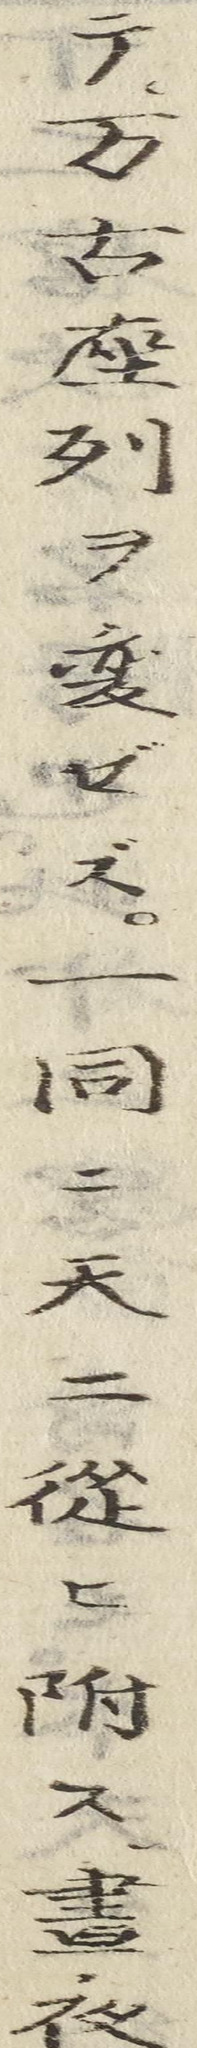テ。万古径列を変ゼズ。一同ニ天ニ従ヒ附ス。昼夜
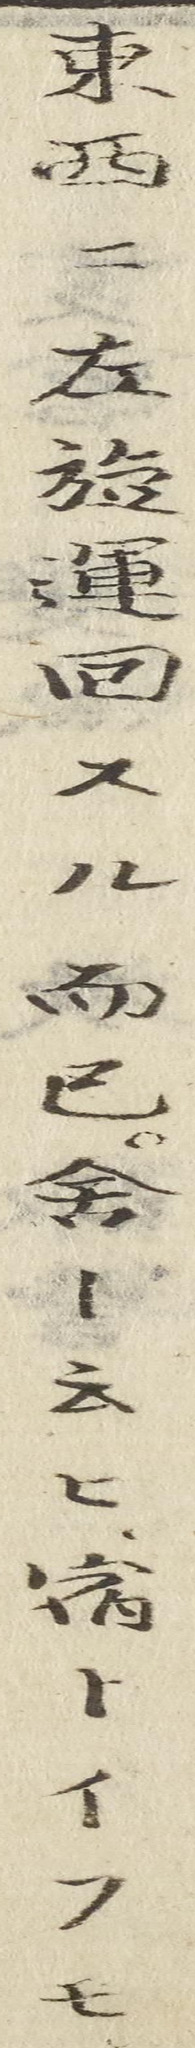東西ニ左旋運回スル而已。舎ト云ヒ。宿トイフモ
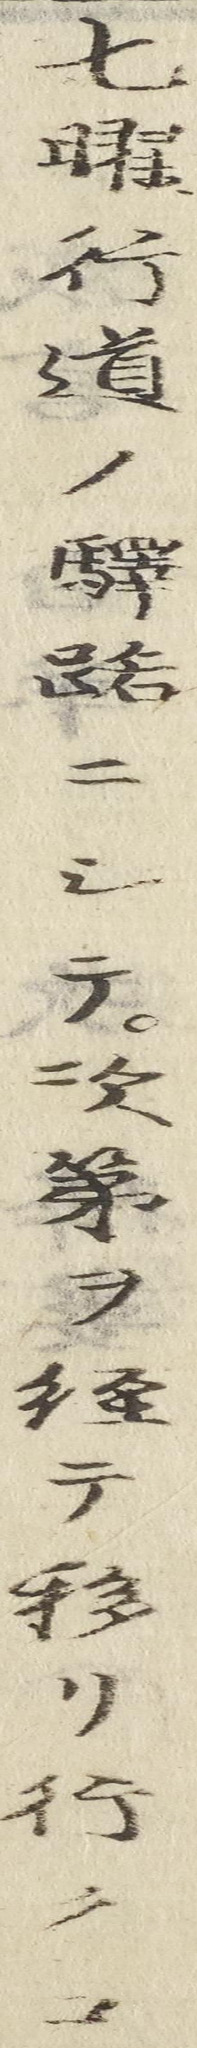七曜行道ノ駅路ニシテ。次第ヲ経テ移リ行クコ
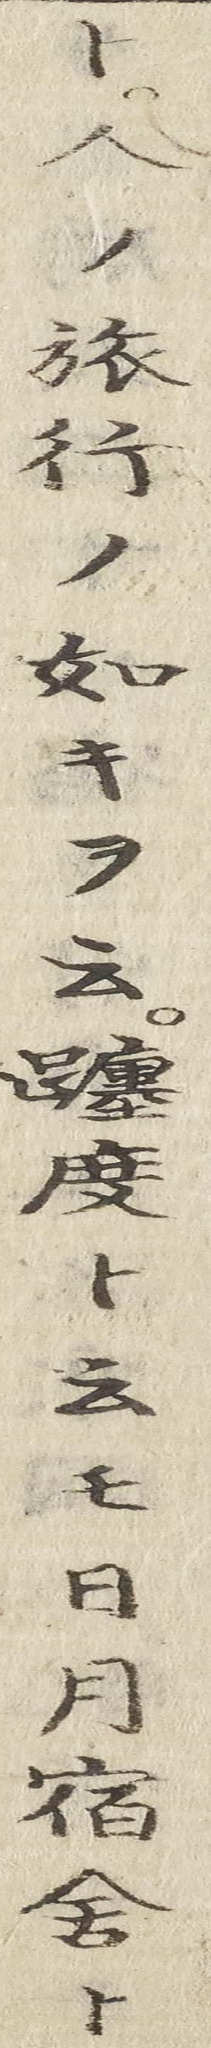ト。人ノ旅行ノ如キヲ云。躔度ト云モ日月宿舎ト
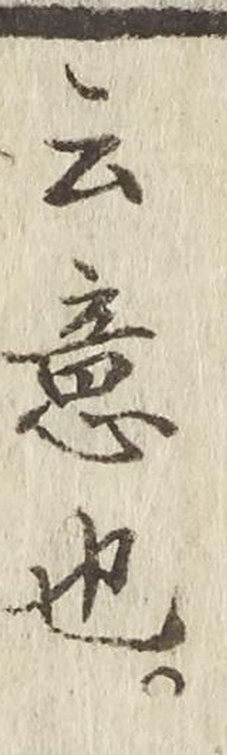云意也。
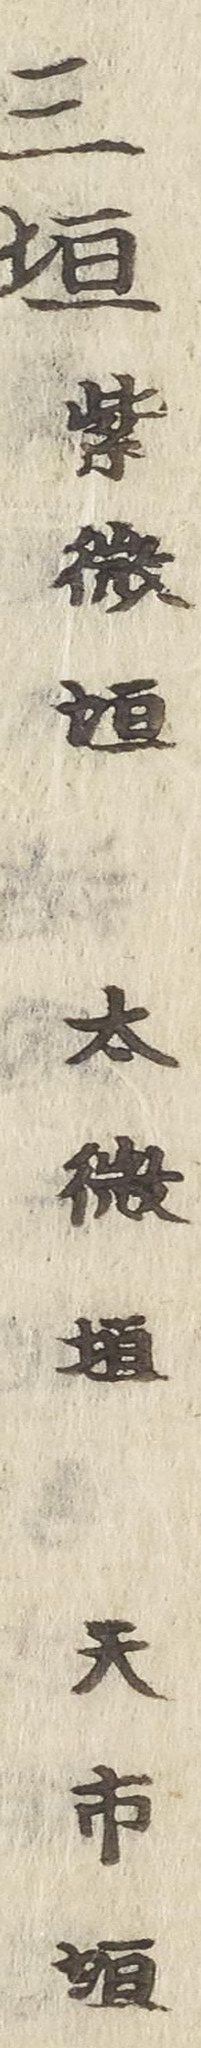三垣紫微垣太微垣天市垣
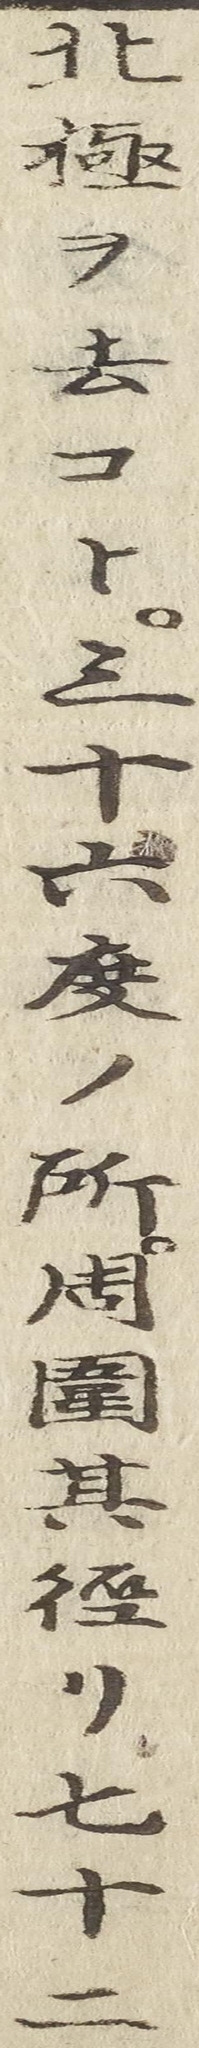北極ヲ去コト。三十六度ノ所。周囲其径リ。七十二
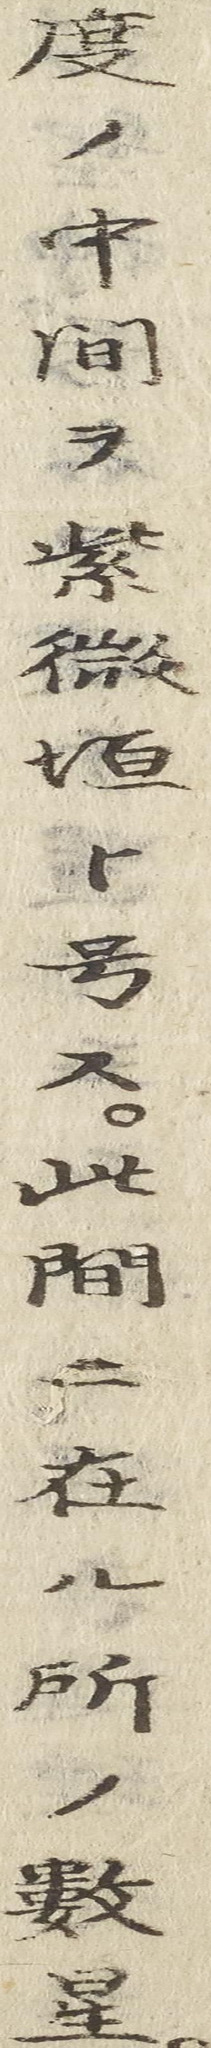度ノ中間ヲ紫微垣と号ス。此間ニ在ル所ノ数星。
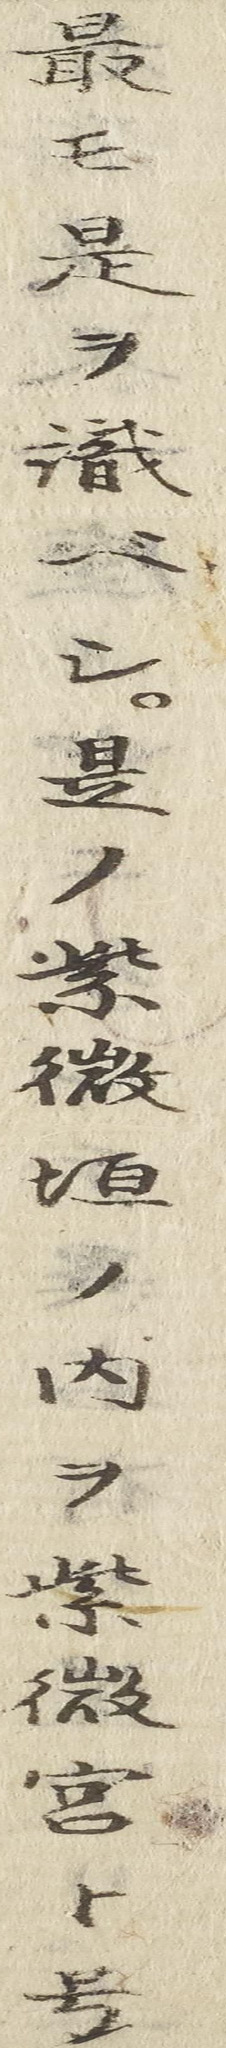最モ是ヲ識ベシ。是ノ紫微垣ノ内ヲ紫微宮ト号
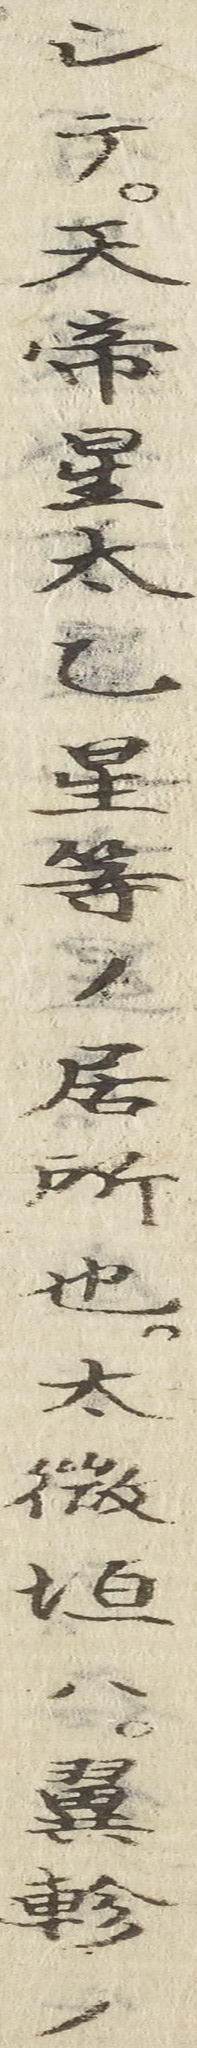シテ。天帝星太乙星等ノ居所也。太微垣ハ。翼軫ノ
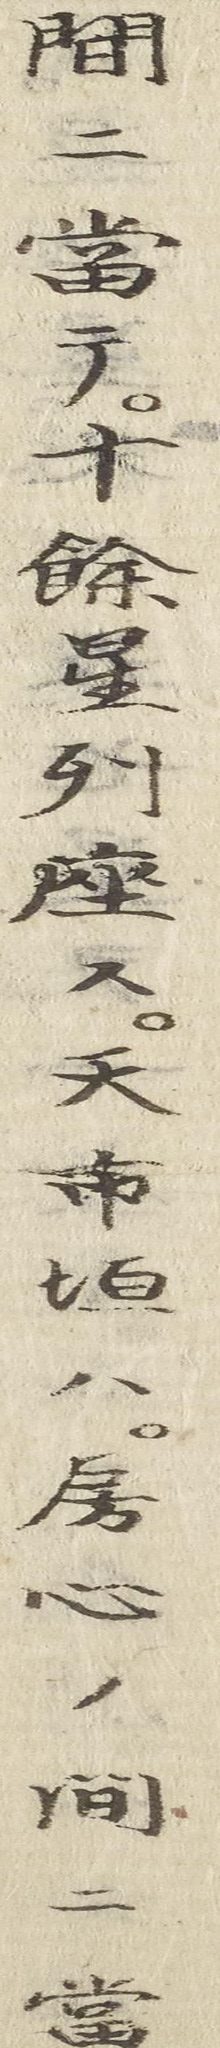間ニ当テ。十余星列座ス。天市垣ハ。房心ノ間ニ当
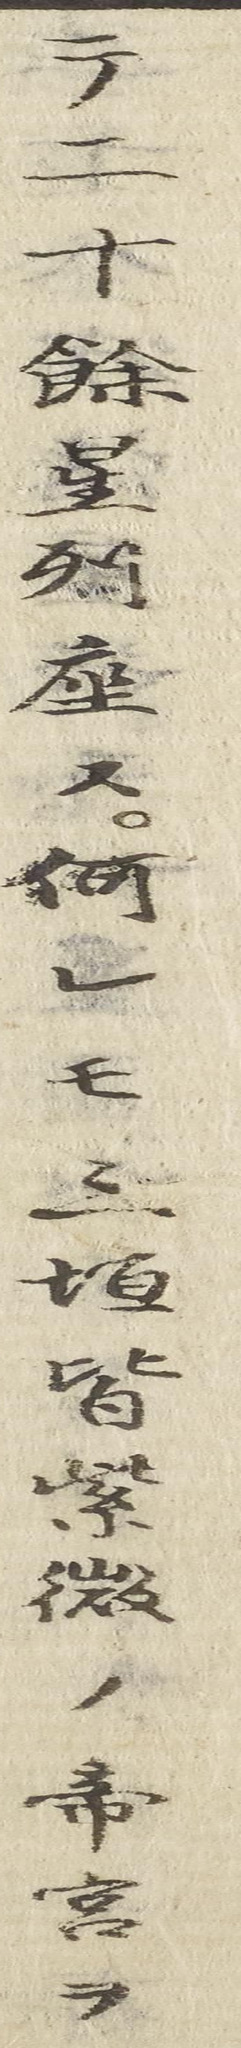テ二十余星座ス。何レモ三垣皆紫微ノ帝宮ヲ
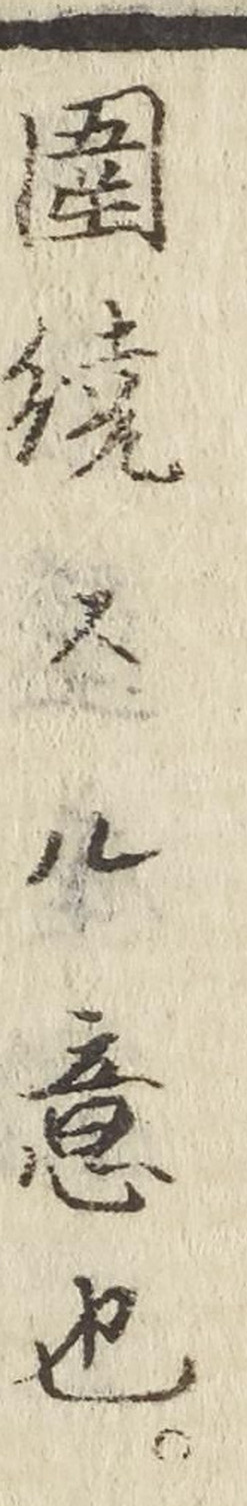囲繞スル意也。

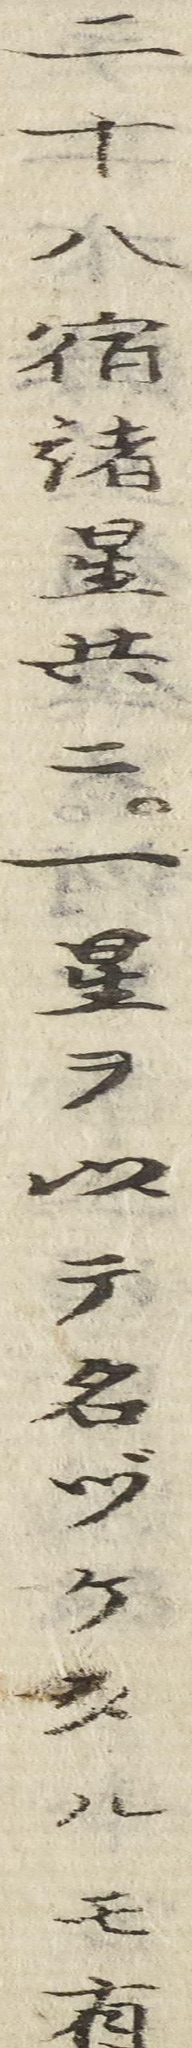二十八宿諸星共ニ。一星ヲ以テ名ヅケタルモ有
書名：大略天学名目鈔　天經或問附録
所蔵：東京大学地震研究所図書室 Earthquake Research Institute Library, The University of Tokyo, JAPAN
